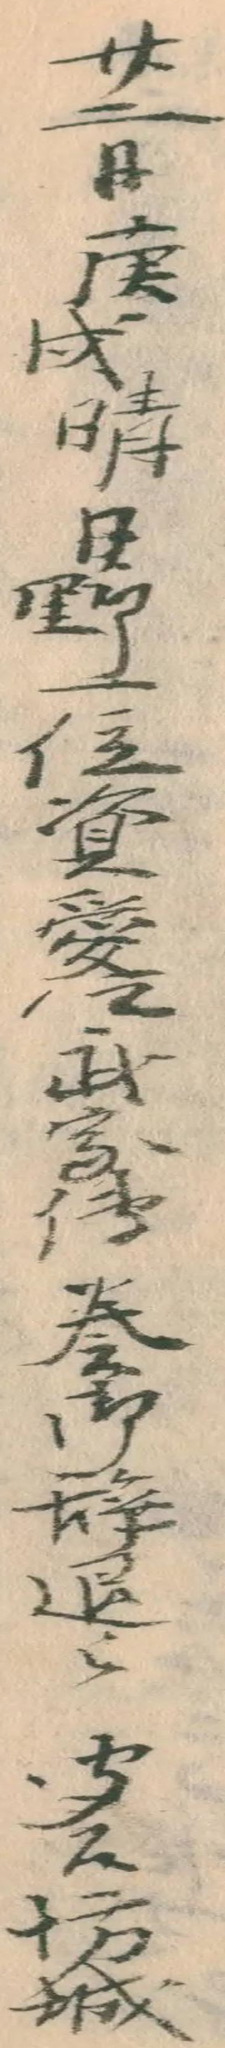廿二日庚戌晴日野一位資愛卿武家傳奏御辞退被聞召坊城
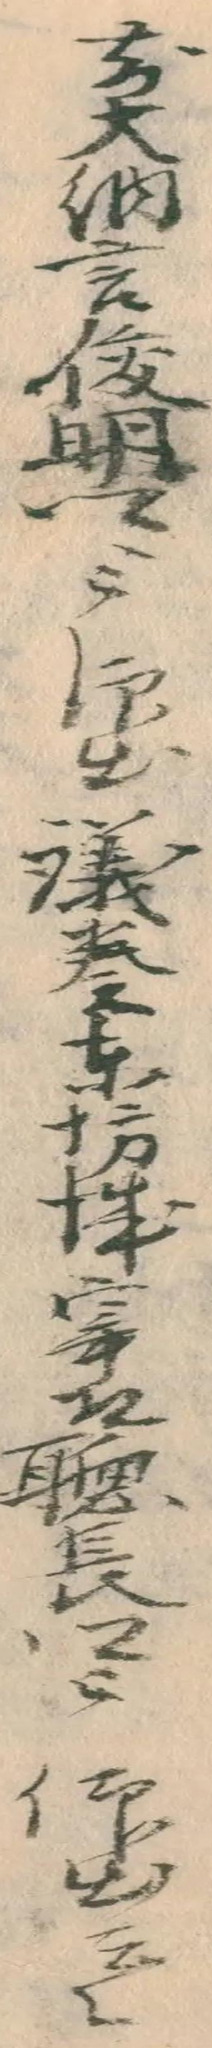前大納言俊明卿へ被仰出議奏東坊城宰相聰長卿被仰出云々
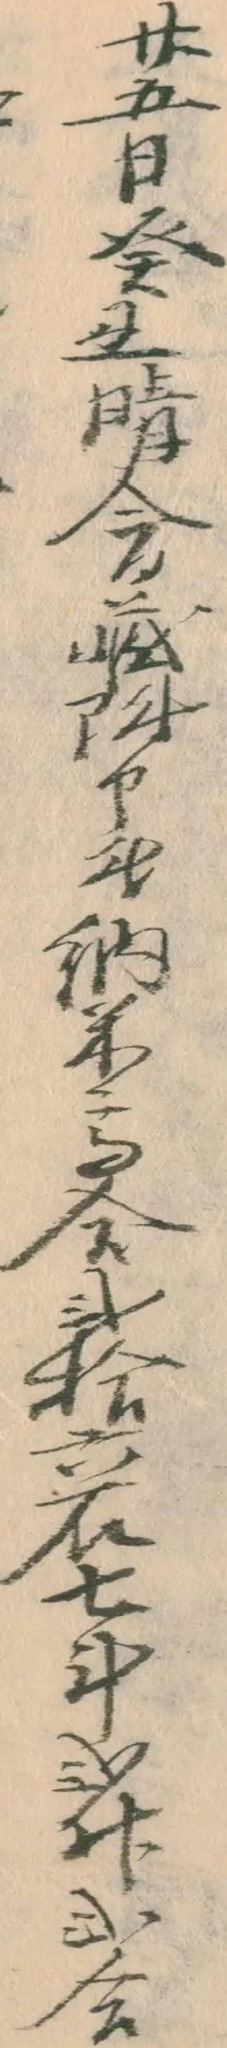廿五日癸丑晴今日蔵附申付納米高合弐拾六石七斗弐升弐合
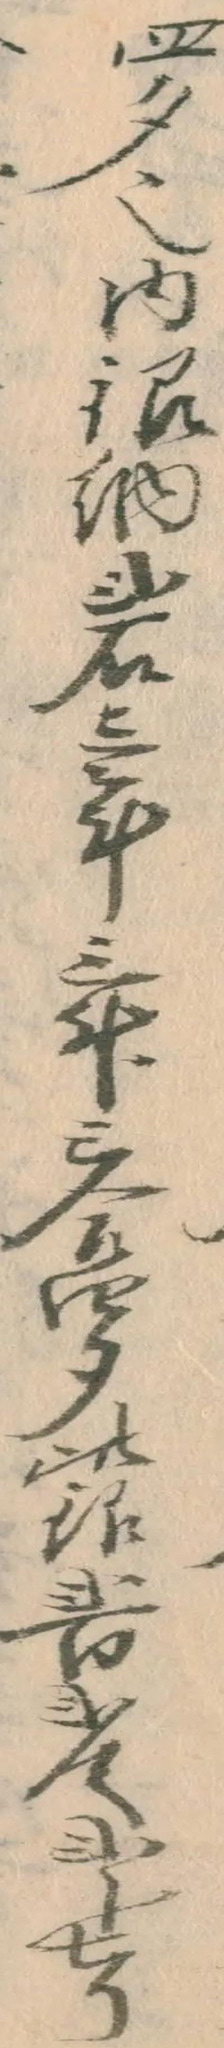四勺也内銀納弐石壱斗三升三合四勺此銀弐百弐匁弐分七り
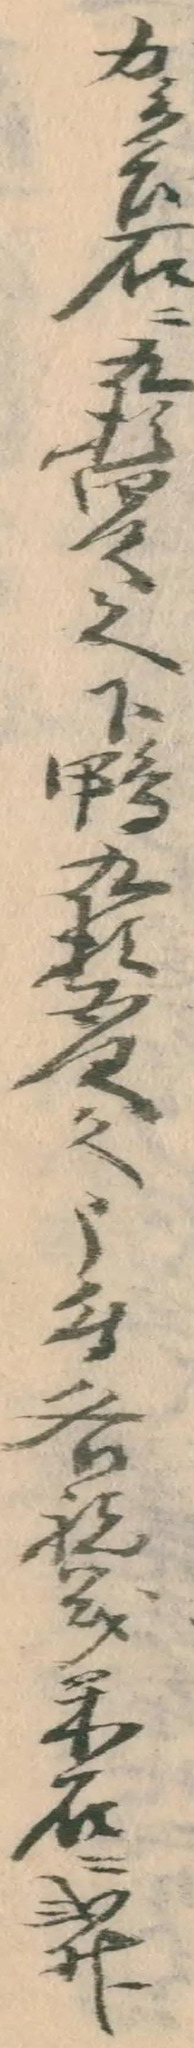賀茂石ニ九拾四貫匁下鴨九拾五貫匁申付各祝義米石ニ弐升
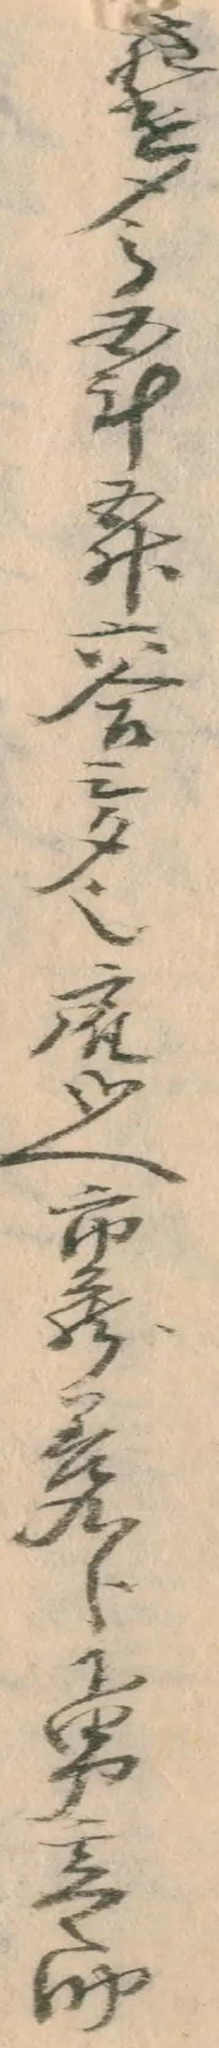遣〆高五斗五升六合三勺也雇弐人市蔵善九郎下男玄之助
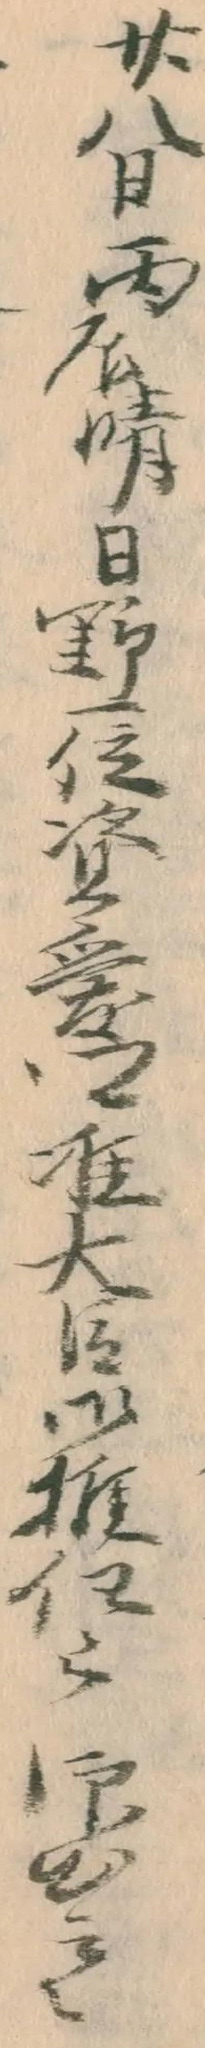廿八日丙辰晴日野一位資慶卿准大臣御推任被仰出云々
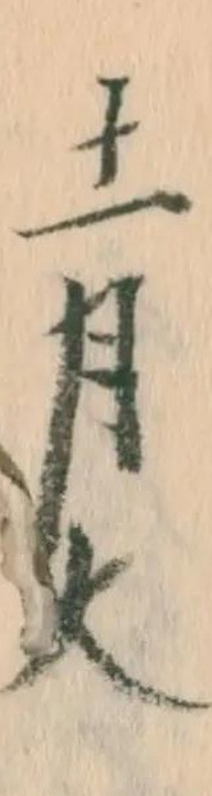十一月大
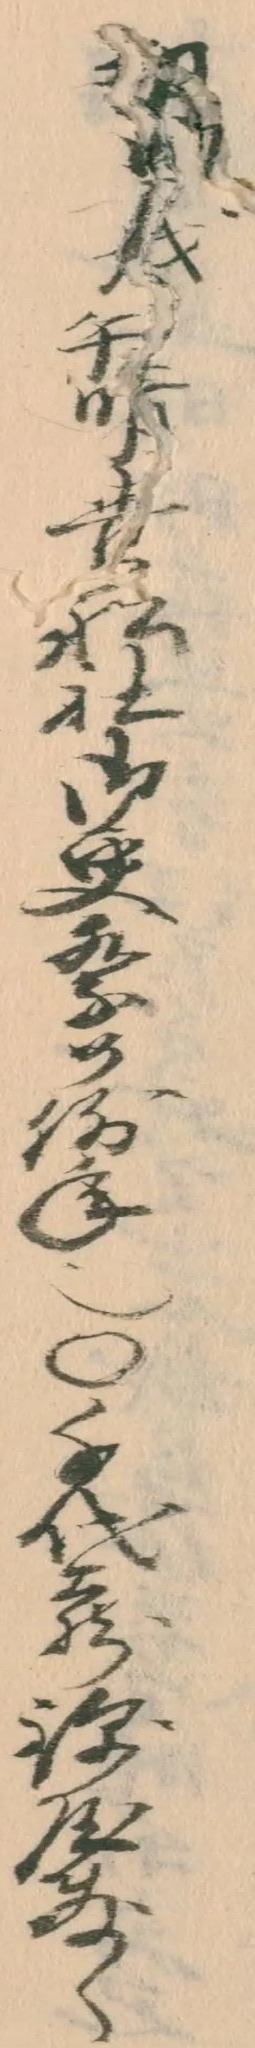朔日戊午晴貴舩社御更祭如例年也○千代蔵錦屋敷へ
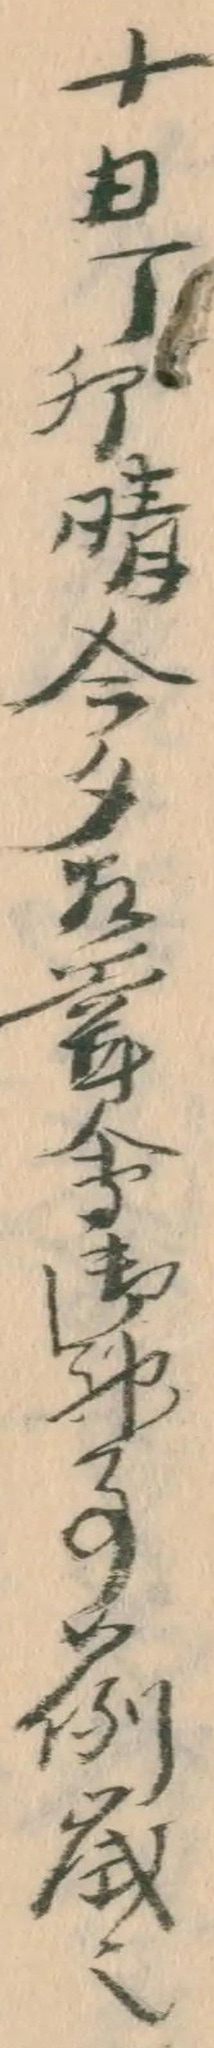十日丁卯晴今夕相暮会御神事如例歳也
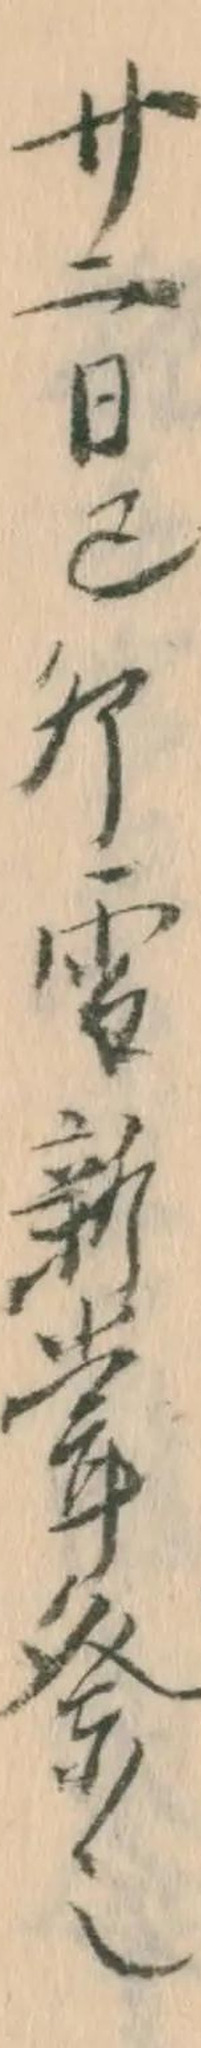廿二日己卯雪新嘗祭也
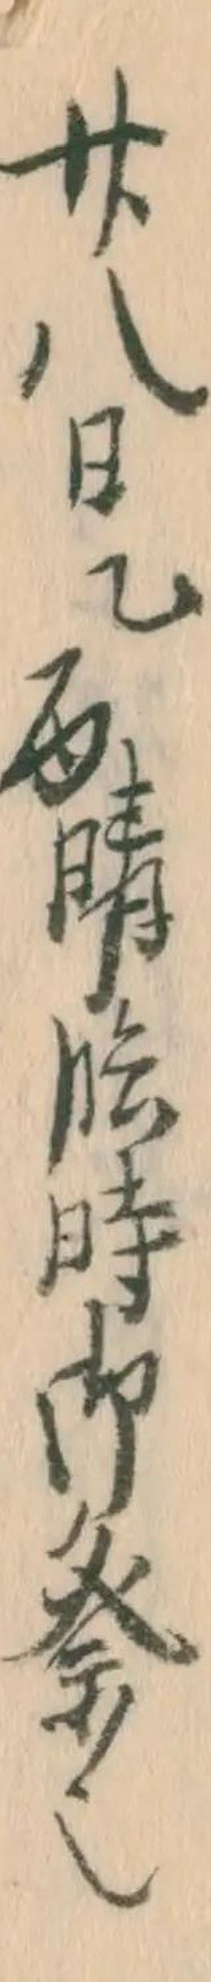廿八日乙酉晴臨時御祭也
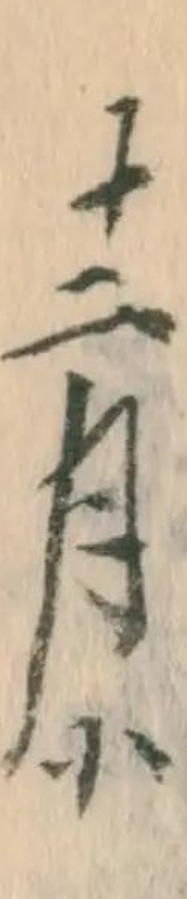十二月小
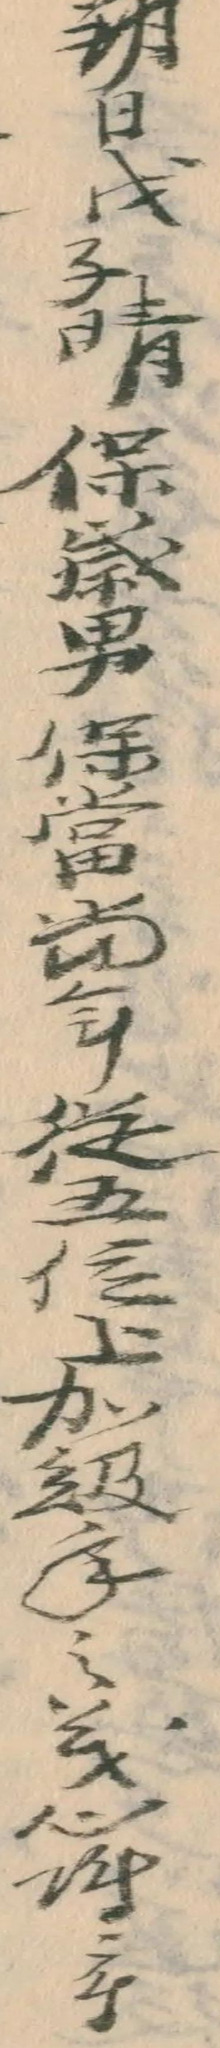朔日戊子晴保歳男保當當年従五位上加級年之義心附ニ付
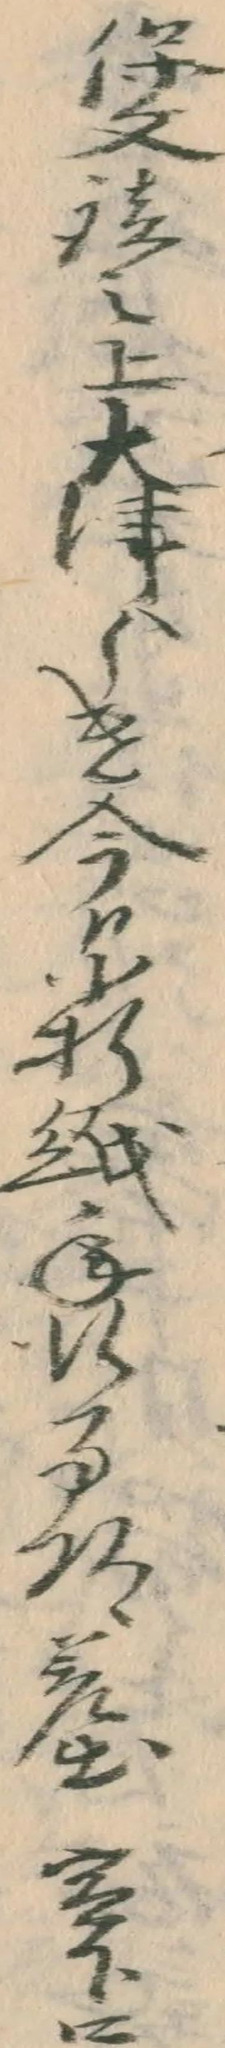保文談之上大津へ申遣今日小折紙年行事頭へ差出宣下口
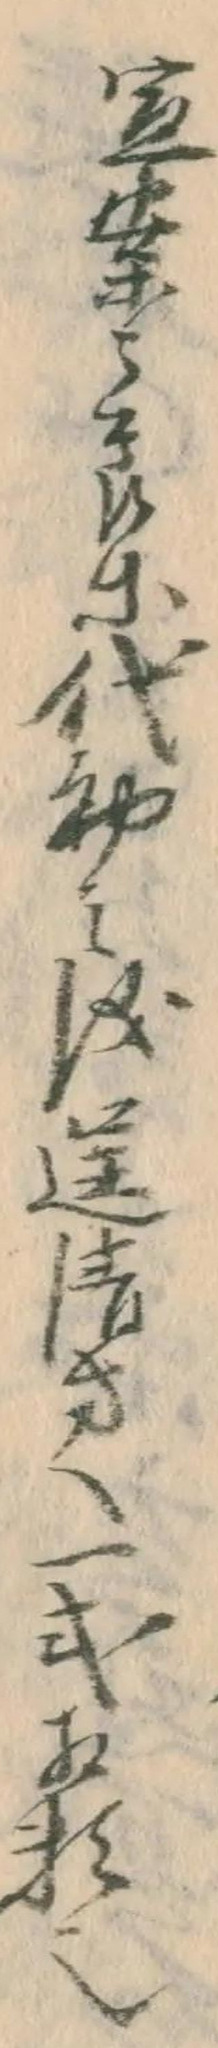宣案之節等代勤之儀逞清方へ一式相頼也
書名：賀茂社記録. 第70冊
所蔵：国立国会図書館 National Diet Library, JAPAN
